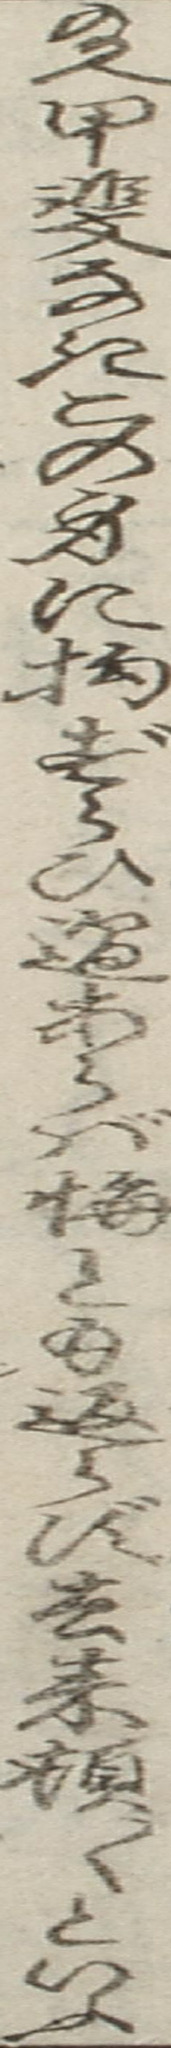給へ。甲斐なきこの身に拘ずらひ。過あらば悔とも返らず。去来頓〳〵といふ
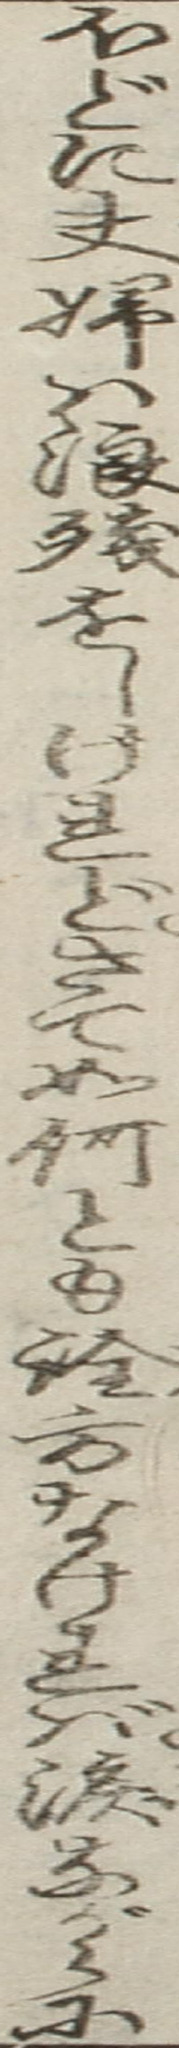ほどに。夫婦は浪残をしけれど。さて如何とも詮方なければ。涙ながらに
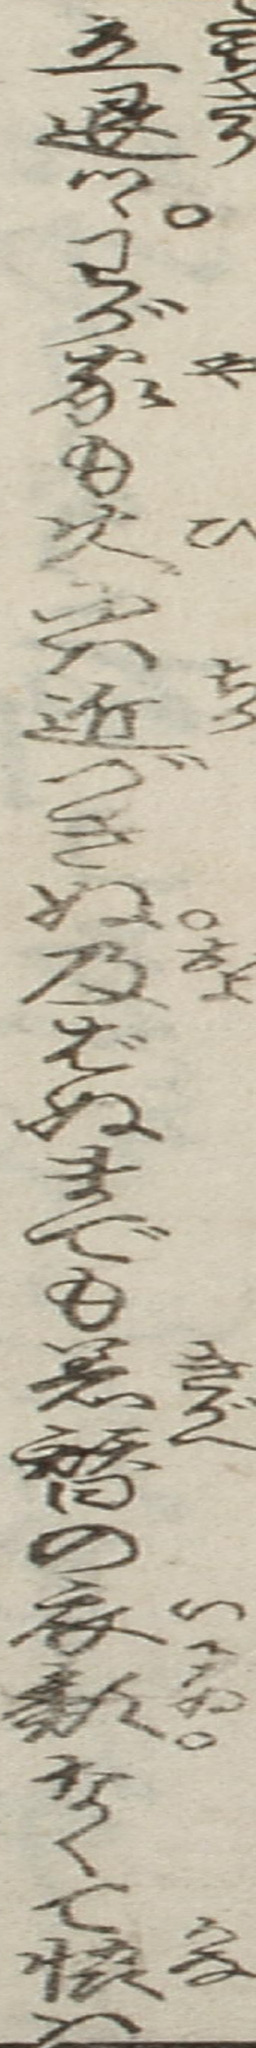立退つゝ。わが家も火には近づきぬ。及ばぬまでも着替の衣類。なくて協は
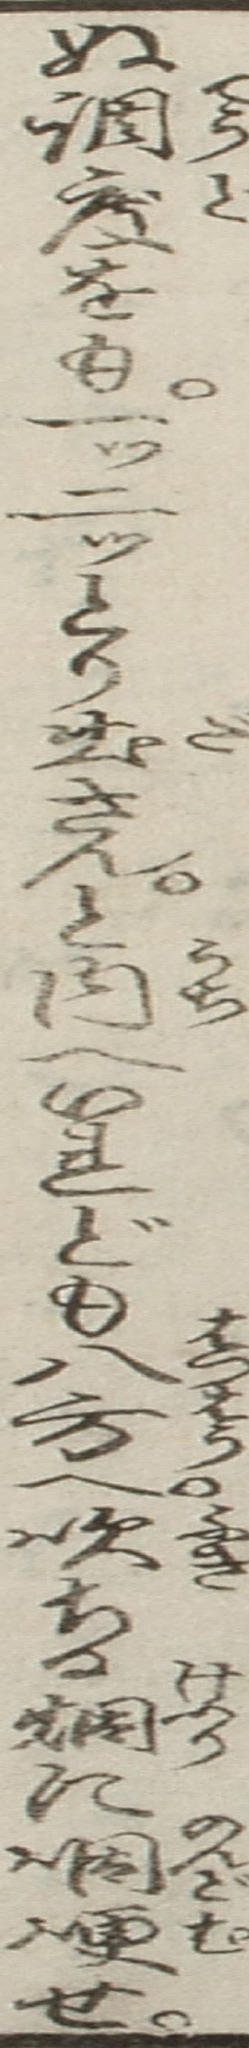ぬ調度をも。一ツ二ツとり出さん。と内へいれども八方へ。吹ちる烟に咽哽せ。
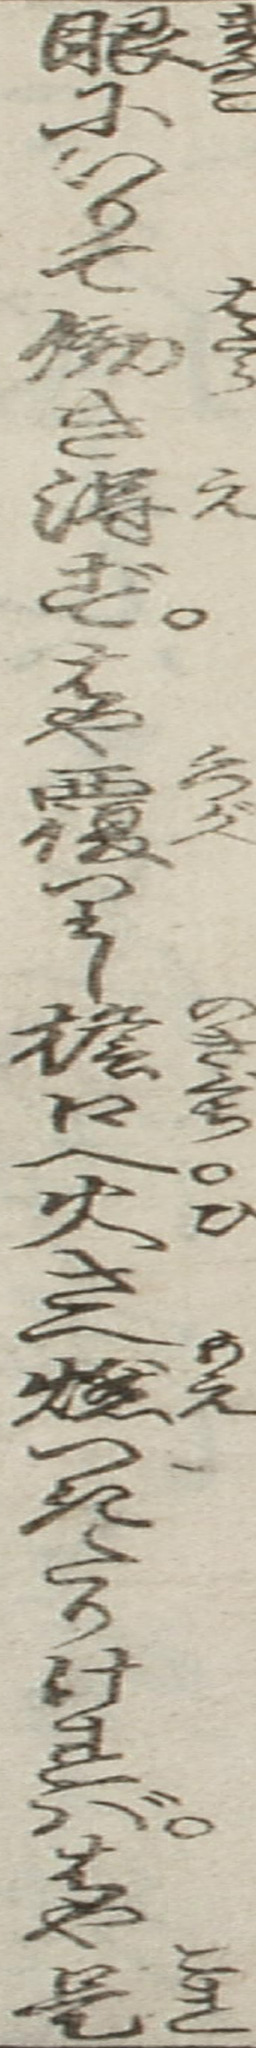眼にいりて働き得ず。はや覆りし檐口へ。火さへ燃つきたりければ。はや是
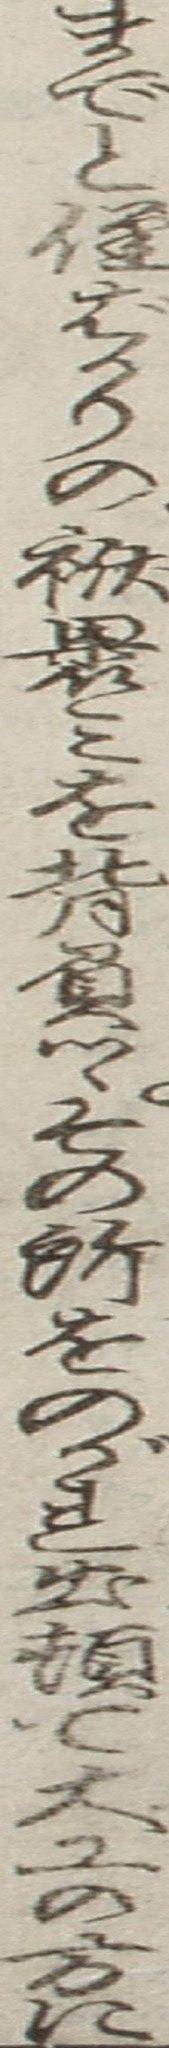までと僅ばかりの。袱裹みを背負つゝ。その所をのがれ出。頓て大工の方に
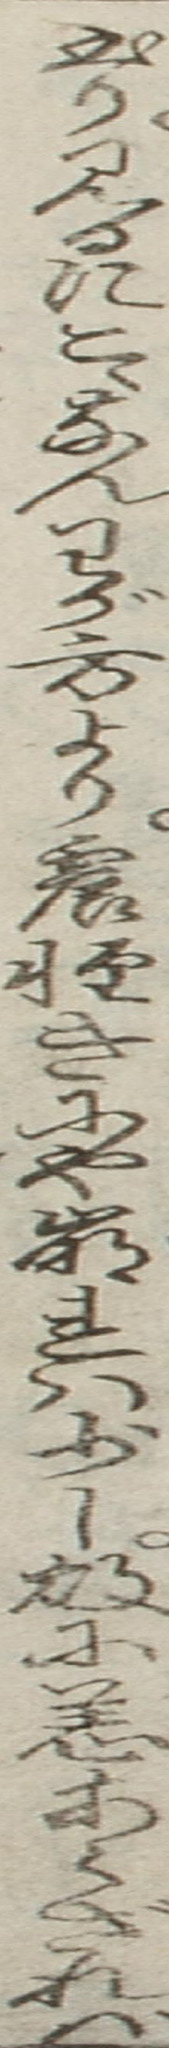至り。見るにこゝなんわが方より。震軽きにや崩れは少し。故に恙あらざれば。
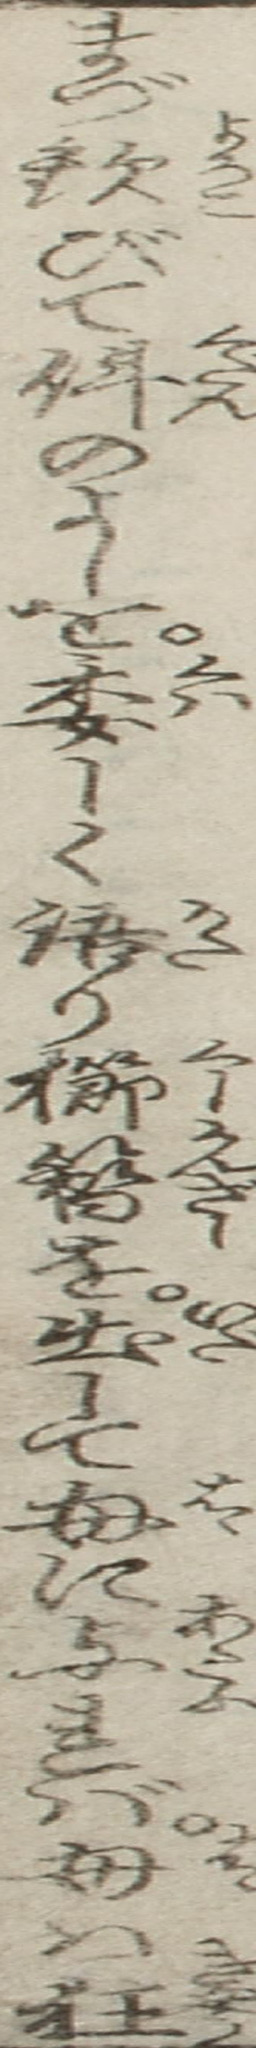まづ歓びて件のよしを。委しく語り櫛簪を。出して母に与れば。母は狂

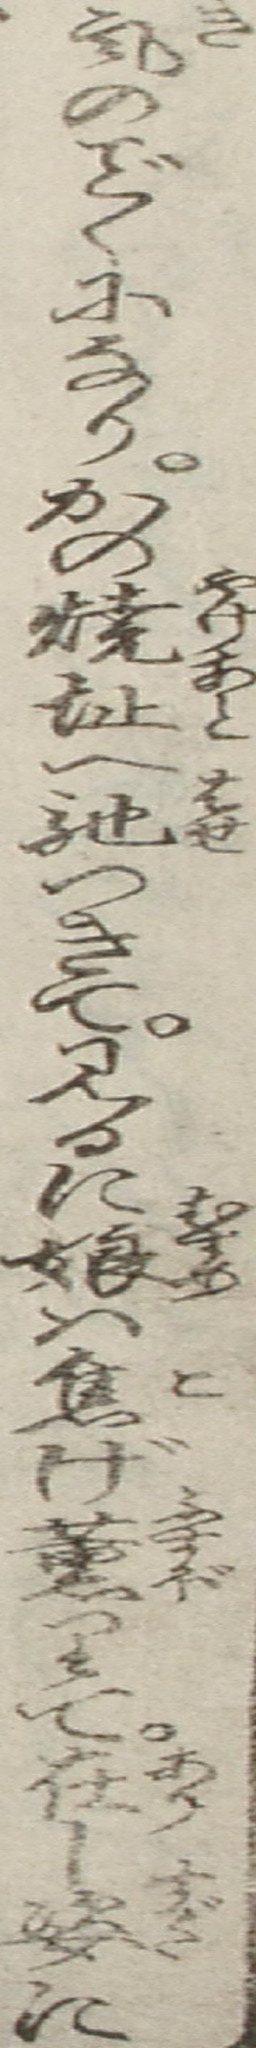気のごとくになり。かの焼址へ馳つきて。見るに娘は焦げ薫りて。在し姿に
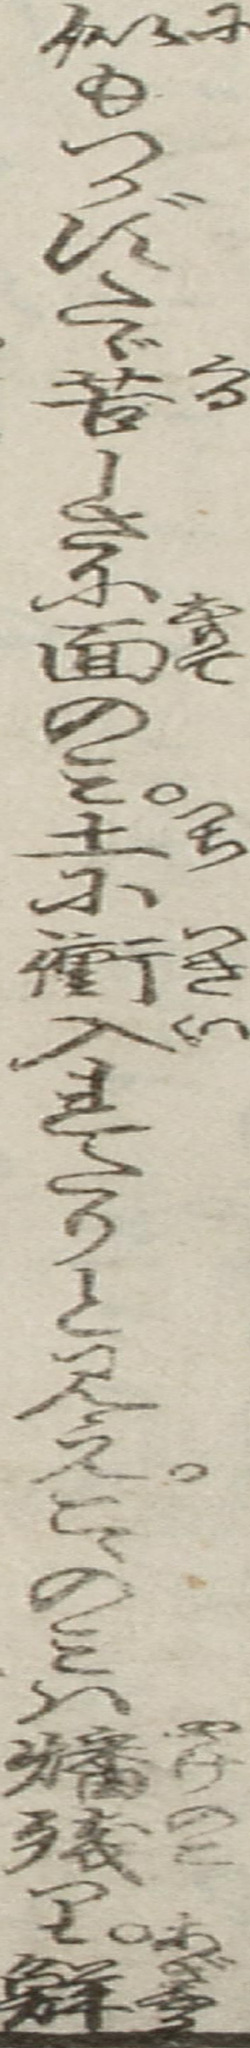似もつかずたゞ苦しさに面のみ。土に衝入れたりと見え。こゝのみは燔残り。鮮
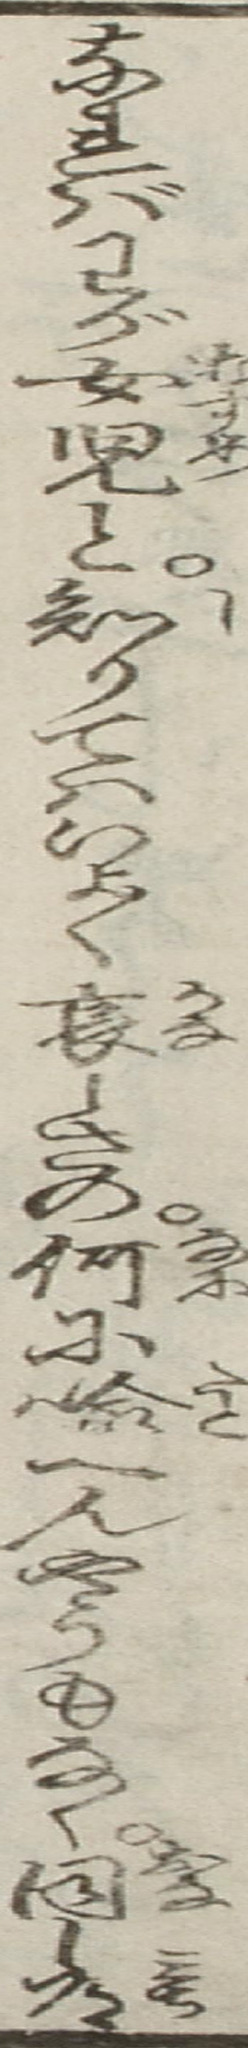なればわが女児と。知りてはいよ〳〵哀しさの。何に喩へんやうもなく。同し道
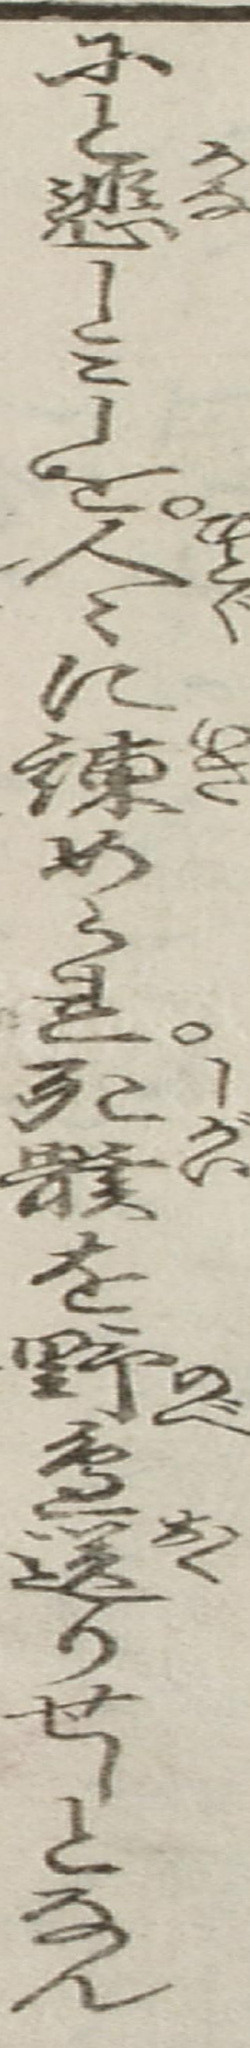にと悲しみしを。人〻に諌められ。死骸を野辺送りせしとなん
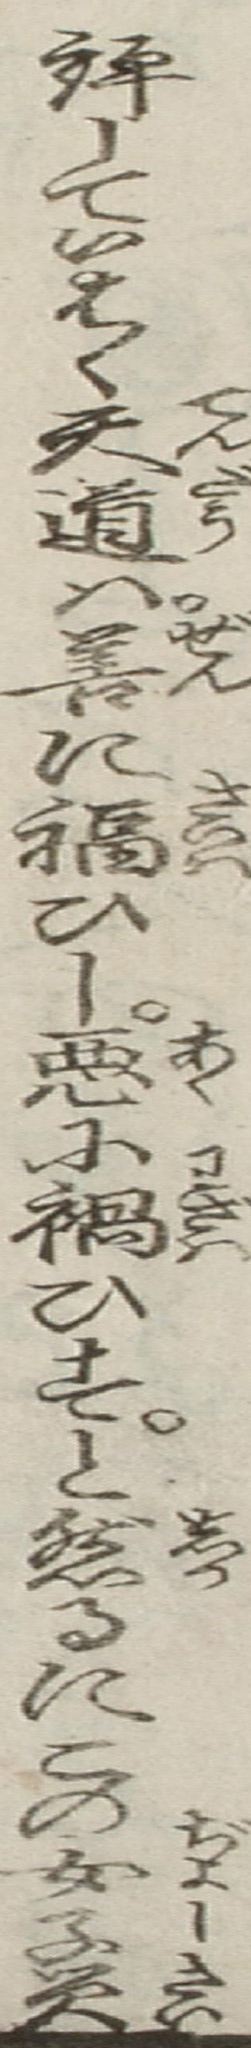評していはく天道は。善に福ひし。悪に禍ひす。と然るにこの女子災
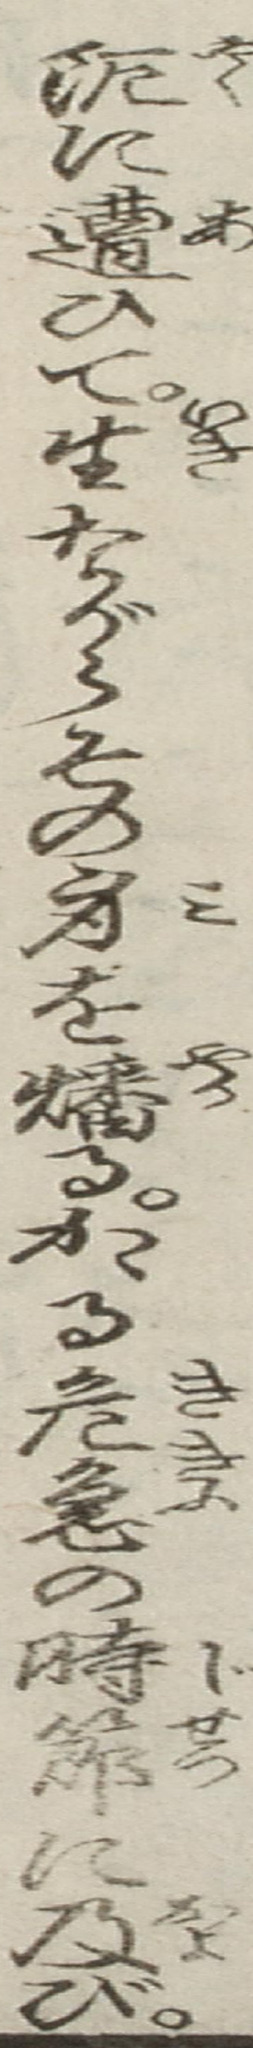阨に遭ひて。生ながらその身を燔る。かゝる危急の時節に及び。
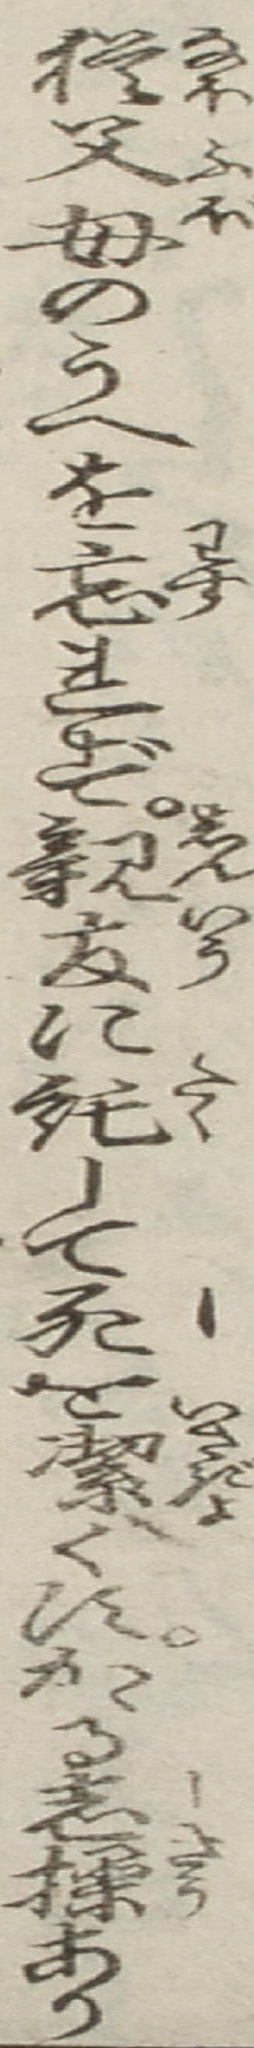猶父母のうへを忘れず。親友に託して死を潔くす。かゝる志操あり
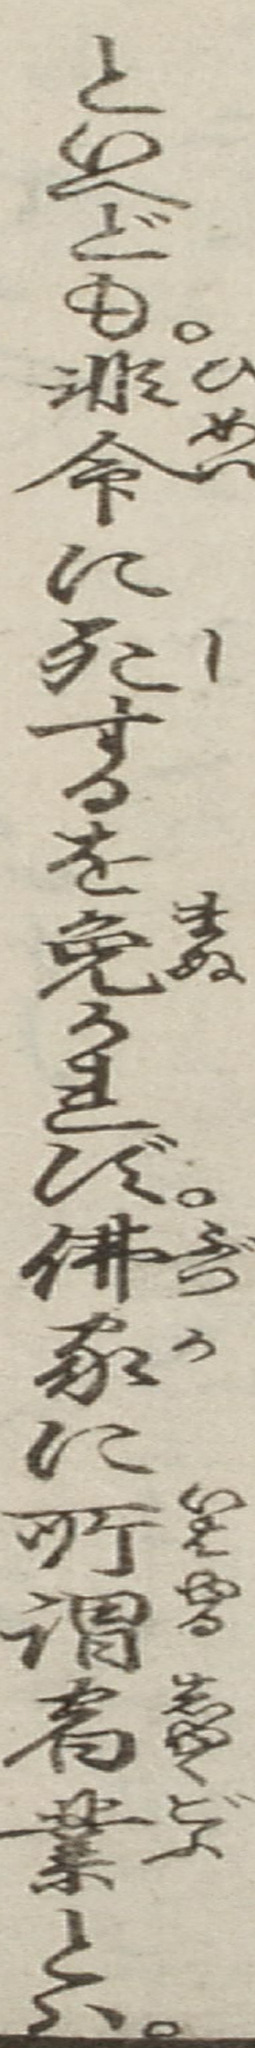といへども。非命に死するを免かれず。仏家に所謂宿業とは。
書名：安政見聞録　上
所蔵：東京大学地震研究所図書室 Earthquake Research Institute Library, The University of Tokyo, JAPAN
